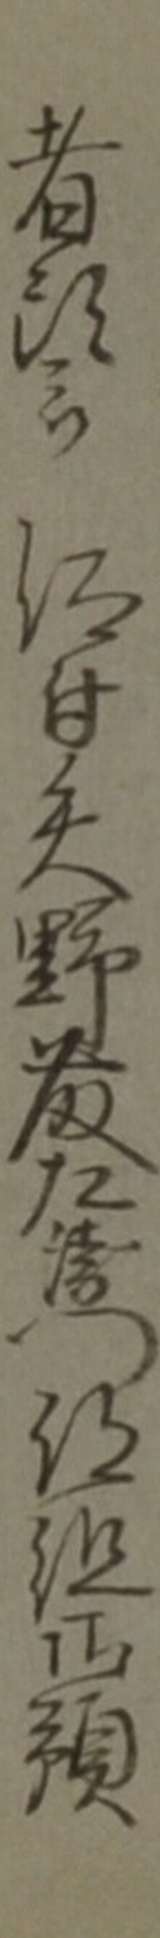者頭被仰付矢野藤左衛門跡組御預
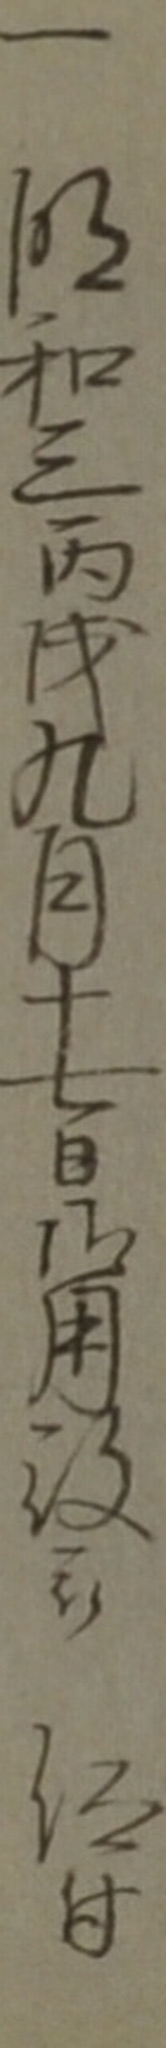一明和三丙戌九月十七日御用役被仰付
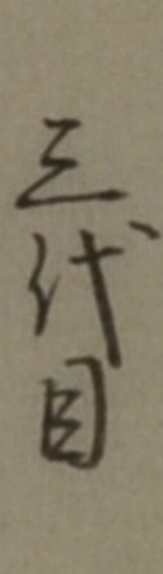三代目
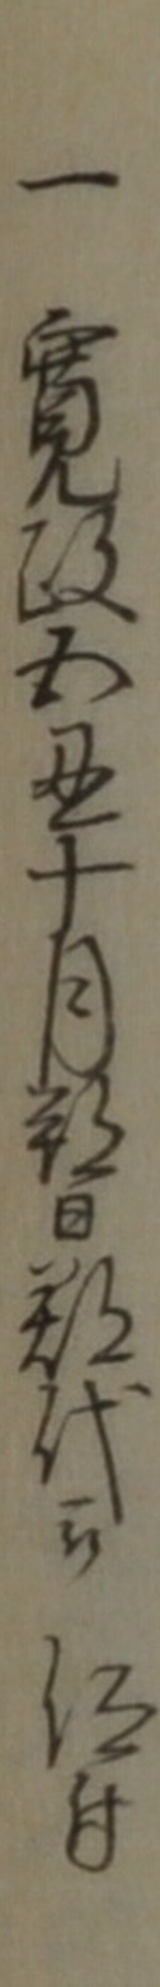一寛政五丑十月朔日郡代被仰付
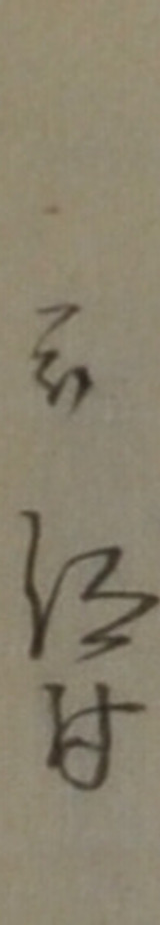被仰付
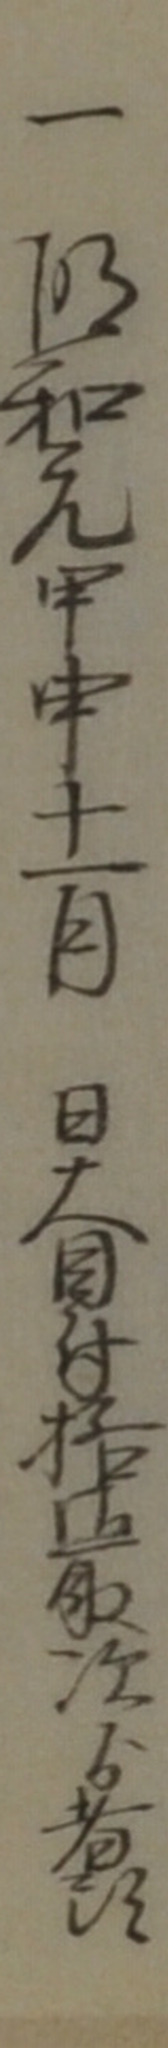一明和元甲申十一月日大目付格御取次ゟ者頭
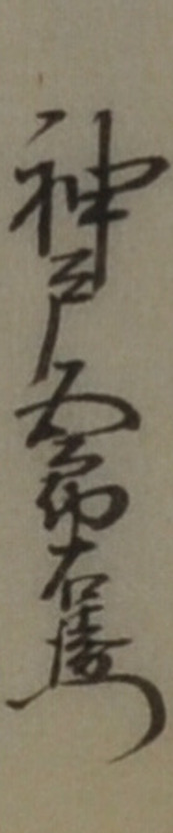神戸五郎右衛門
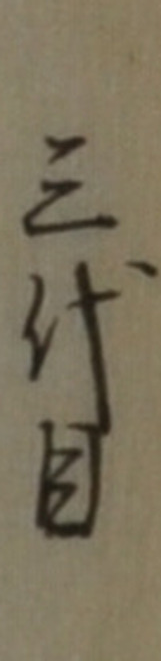三代目
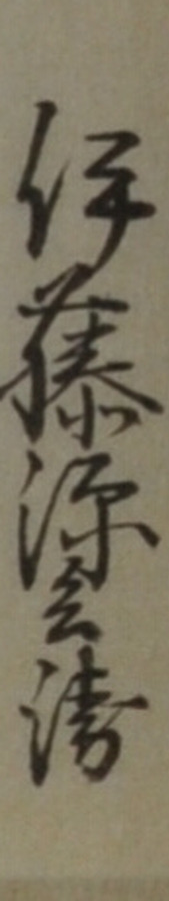伊藤源兵衛
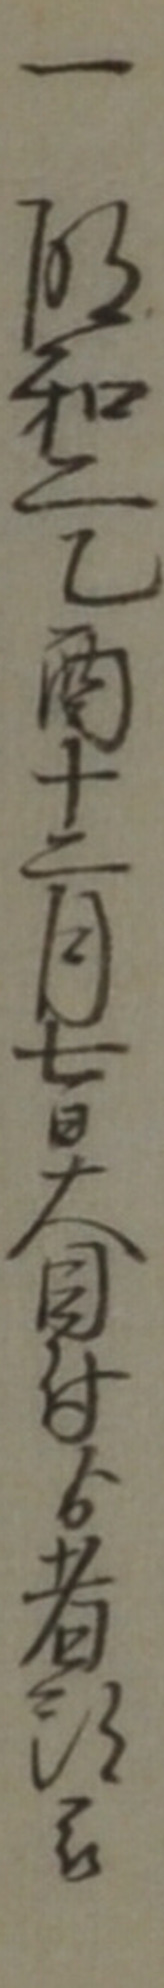一明和二乙酉十二月七日大目付ゟ者頭被
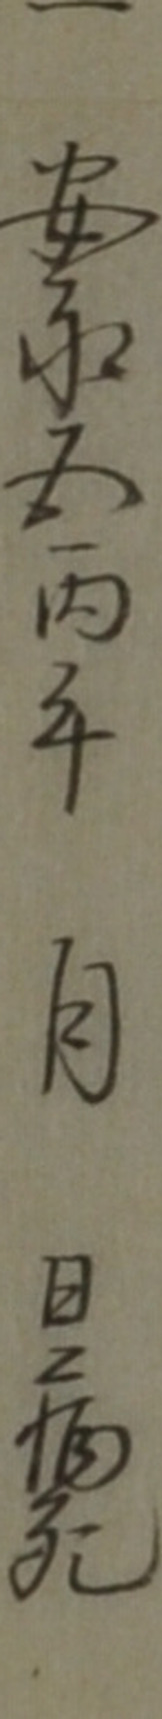一安永五丙午月日病死
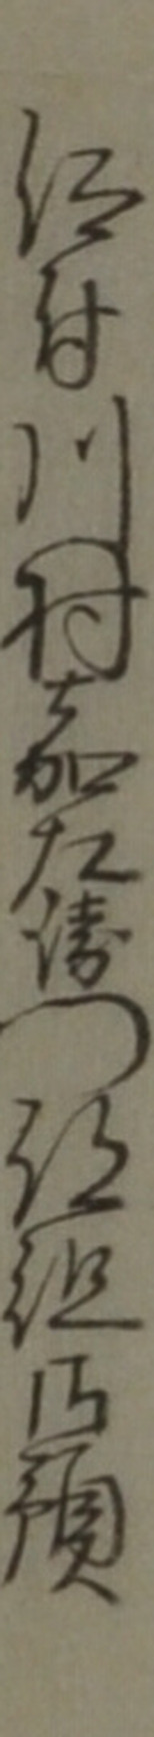仰付川村嘉左衛門跡組御預
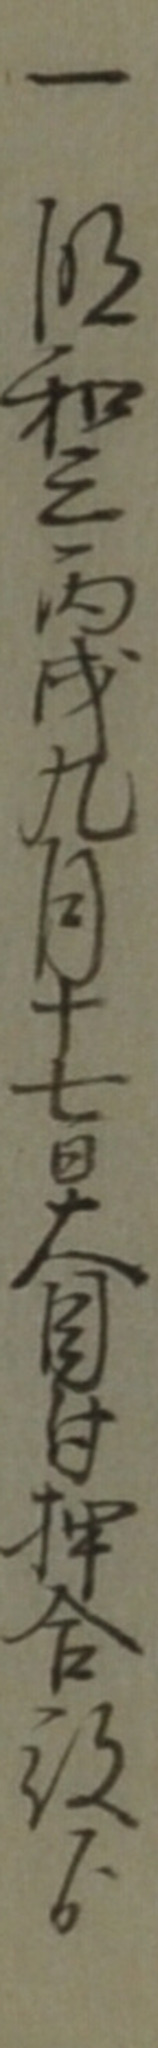一明和三丙戌九月十七日大目付押合役ゟ
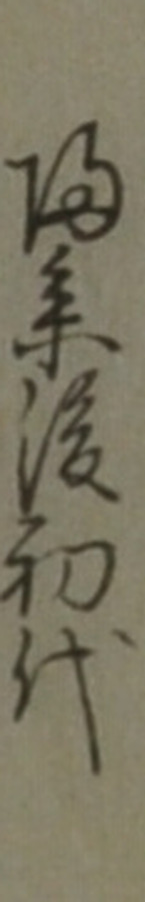帰参後初代
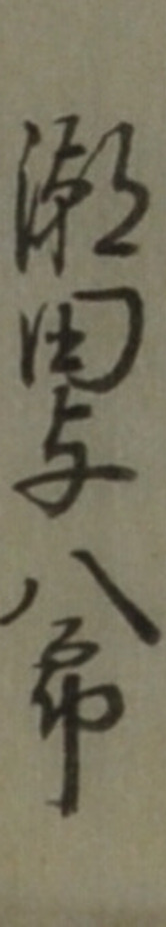瀬田与八郎
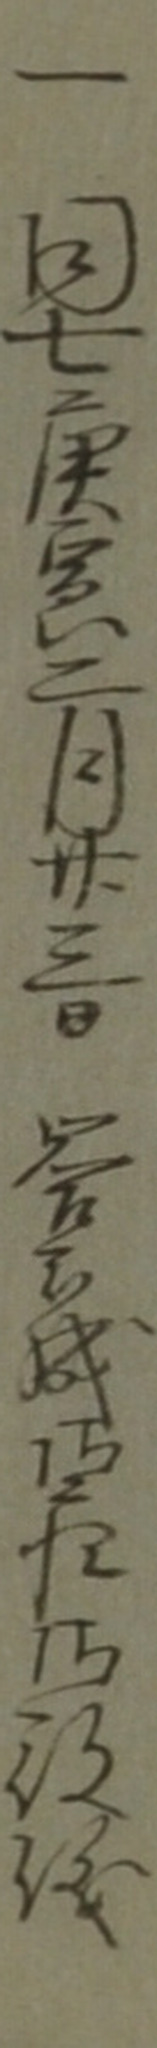一同七庚寅二月廿三日思召被成御座御役儀
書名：諸御役代々録（二）
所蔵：伊那市立高遠町図書館・合同会社AMANE
